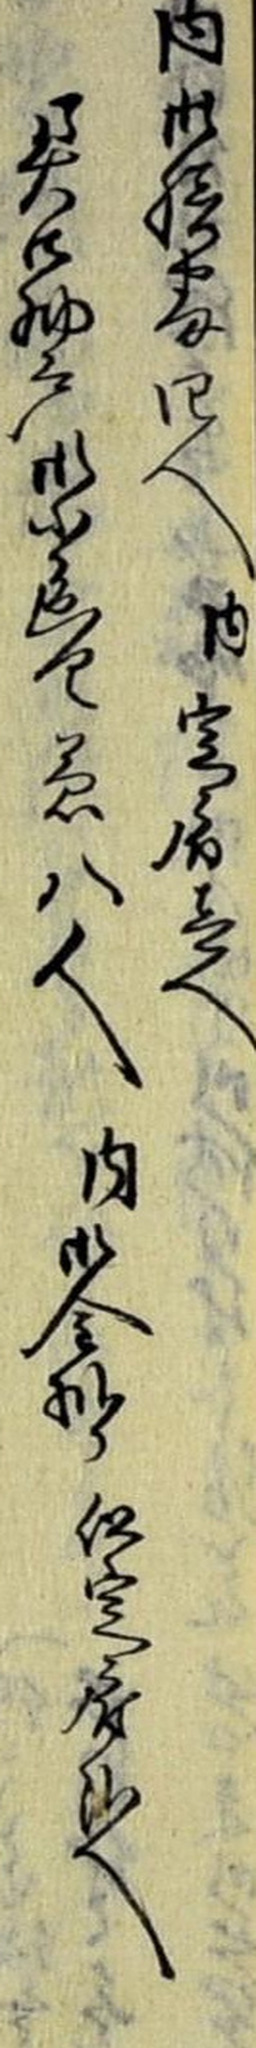奥御納戸御小道具兼八人内御金掛り但定府弐人
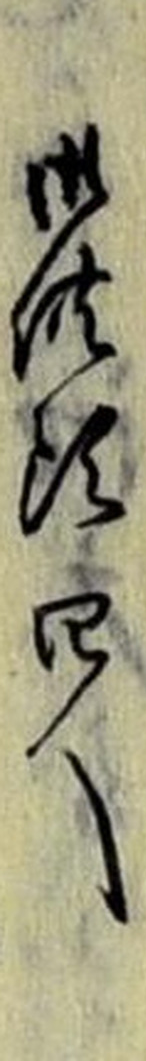御供頭四人
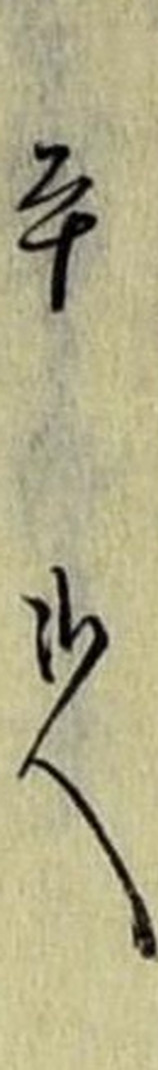平弐人
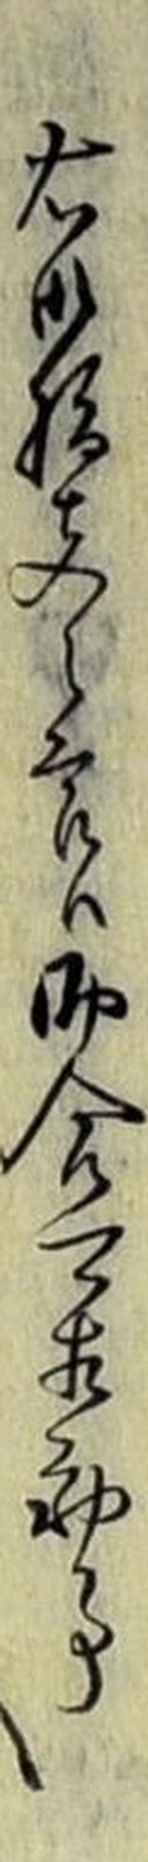右御指支之節は助合可相勤事
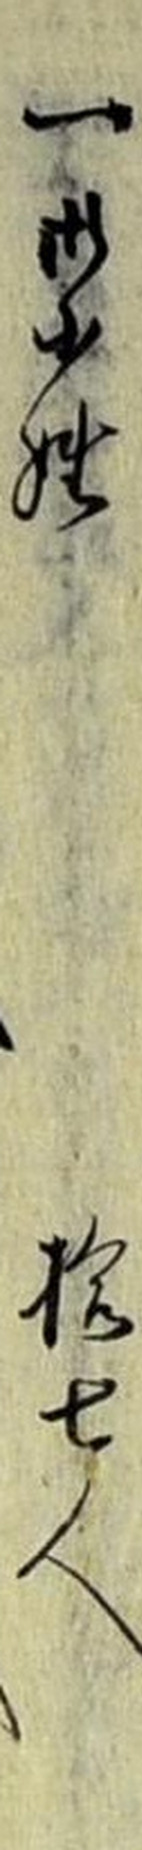一御小姓拾七人
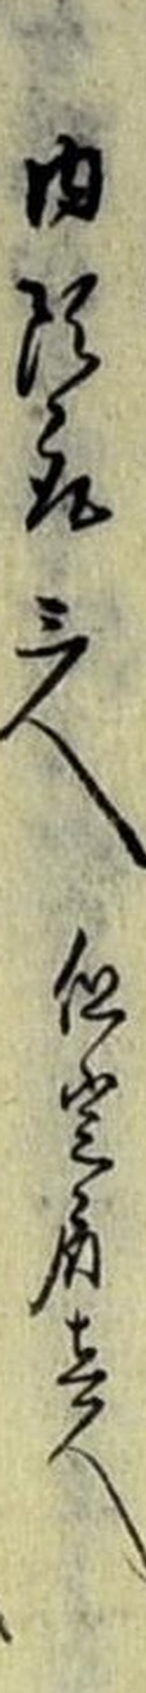内頭取三人但定府壱人
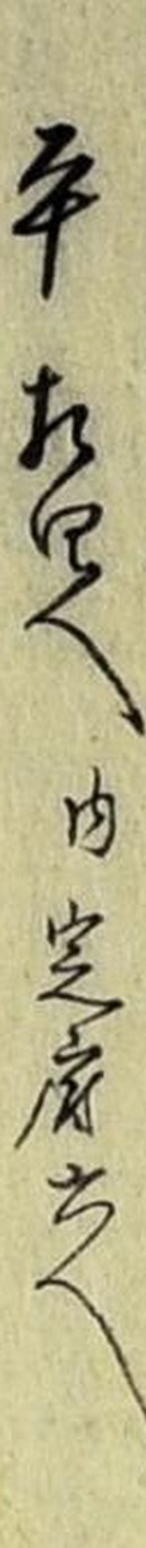平拾四人内定府六人
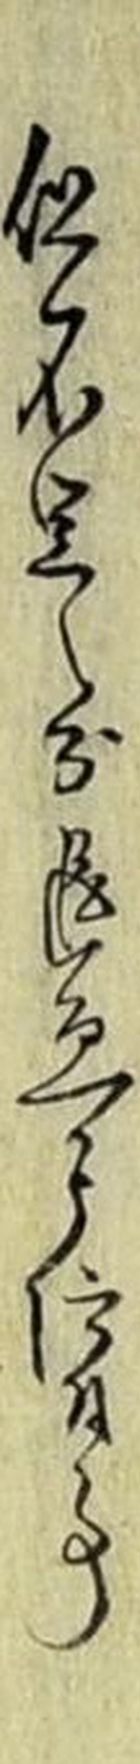但不足之分追而可被仰付事
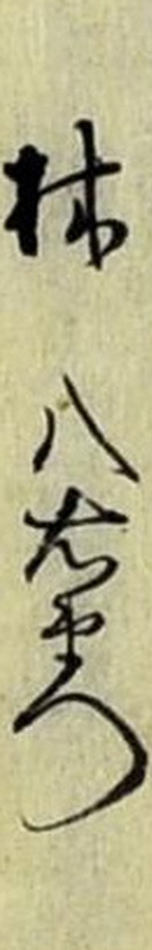林八右衛門
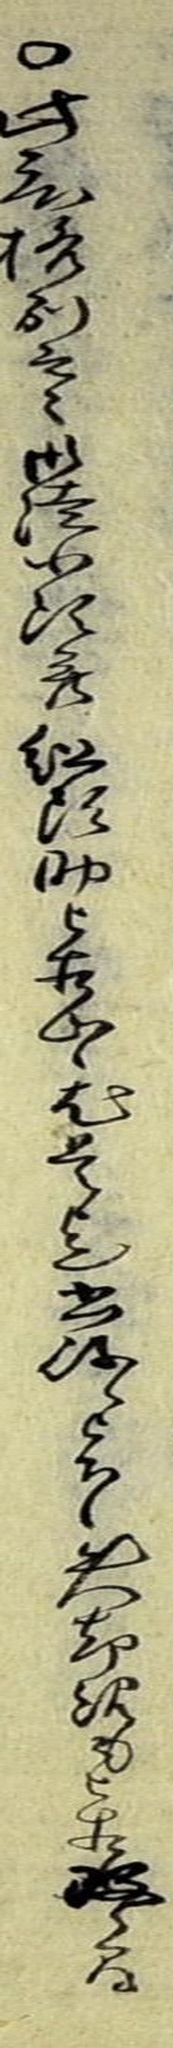〇此度格別云々御徒小頭并組頭助被相止候尤是迄書役被下候失却銀も被相改候間
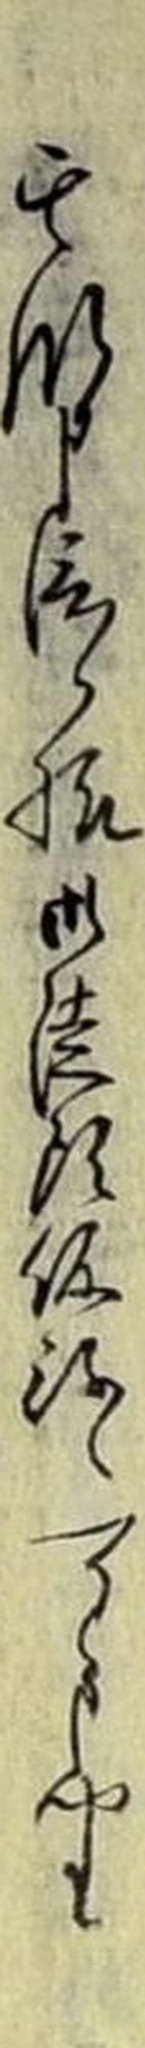其段申渡候様御徒頭仮役へ可被申聞候
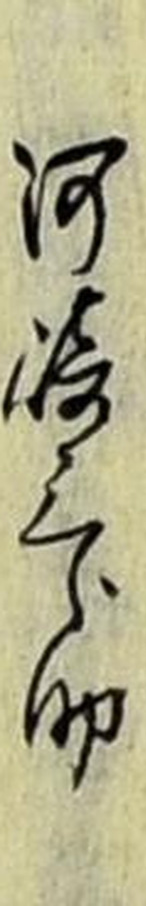河崎三郎助
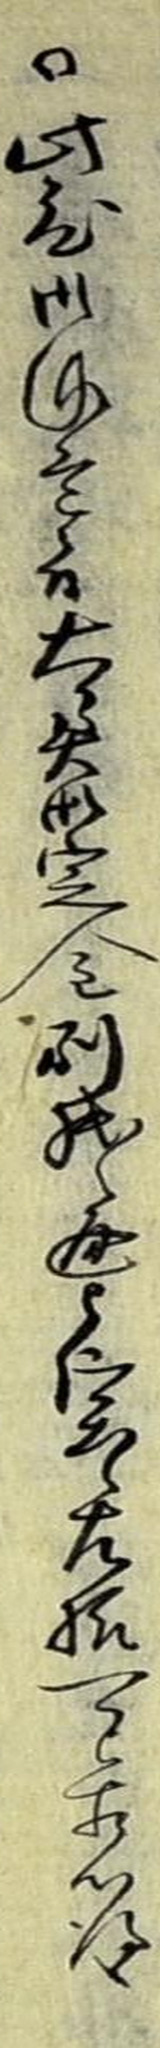〇此度御趣意に付大奥御定金別紙之通被仰出候左様可被相心得候

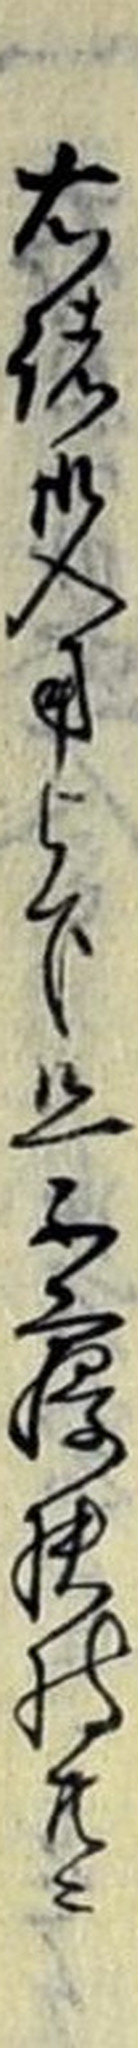右諸御入用被下且不寝扶持共に
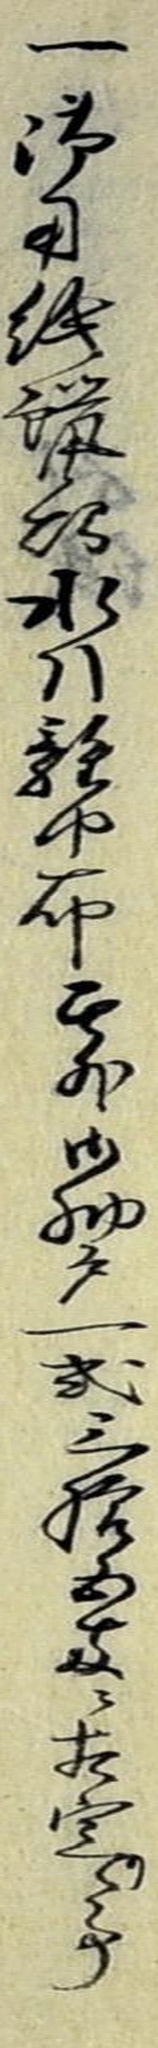一御用紙蝋燭水引雑巾布其外御納戸一式三拾五両に相定り候事
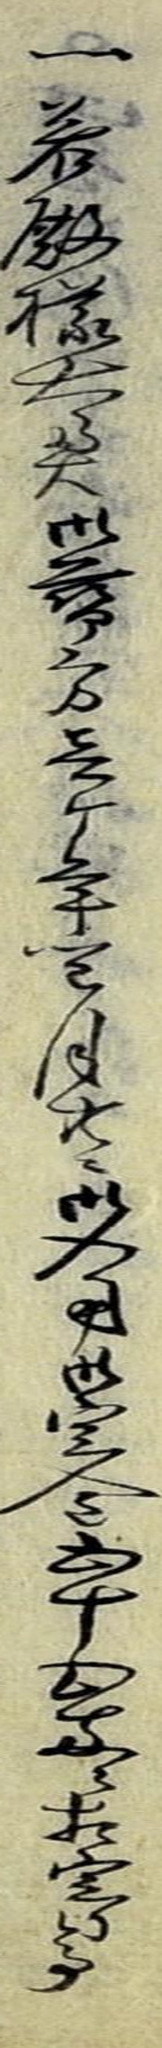一若殿様大奥御暮方壱ケ年閏月共に御入用御定金五十五両に相定り候事
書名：命令之部 二
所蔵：福井県文書館 Fukui Prefectural Archives
